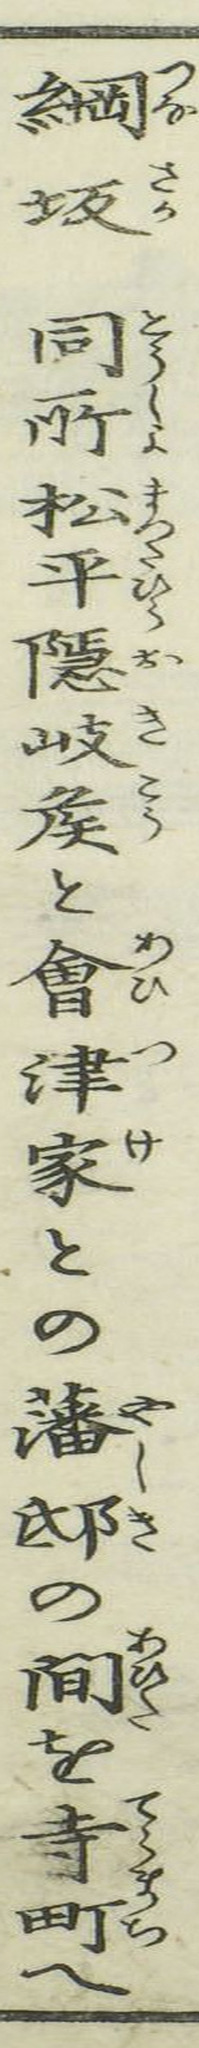綱坂同所松平隠岐侯と會津家との藩邸の間を寺町へ

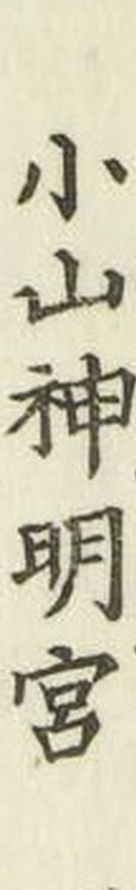小山神明宮
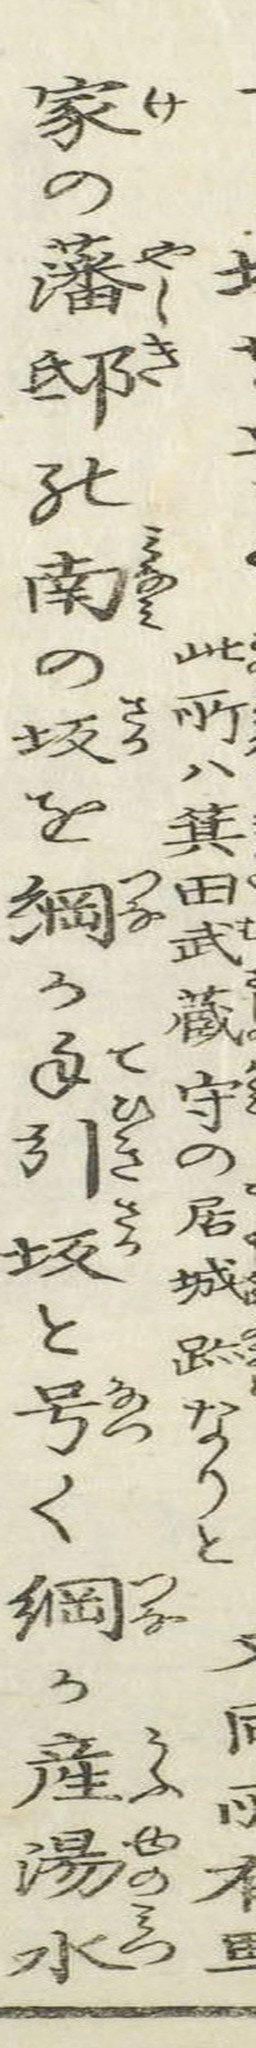家の藩邸の南の坂を綱か手引坂と号く綱か産湯水
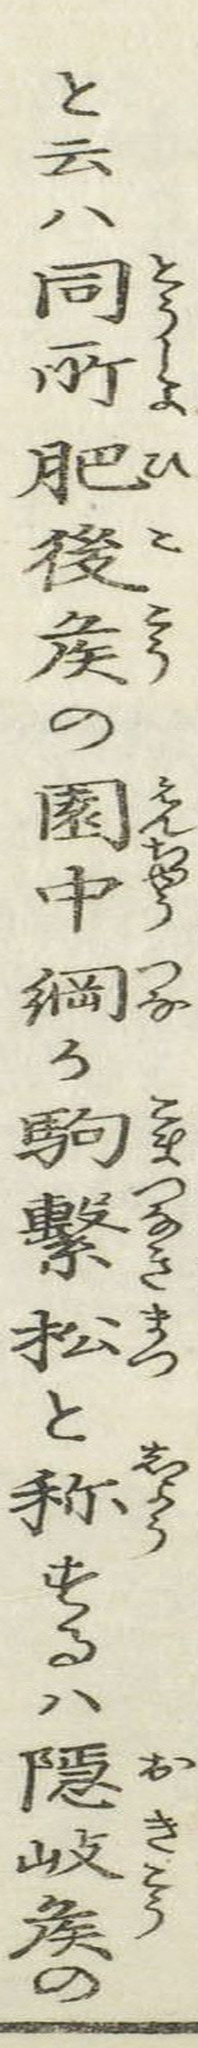と云は同所肥後侯の園中綱か駒繋松と称するは隠岐侯の
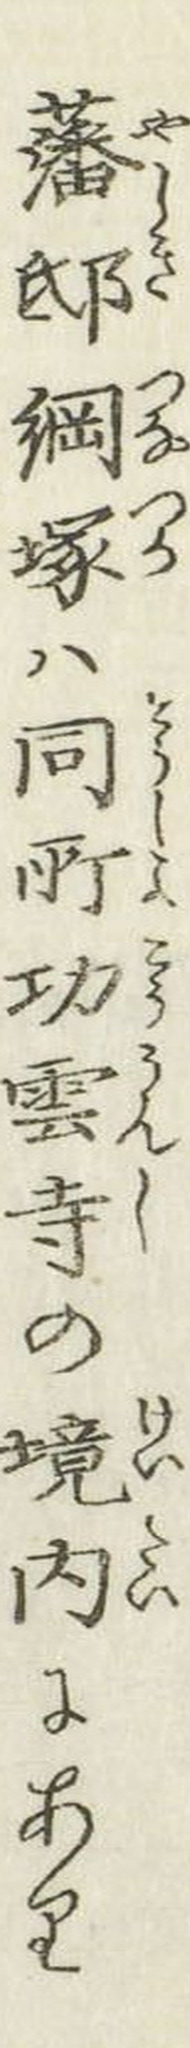藩邸綱塚は同所功雲寺の境内にあり
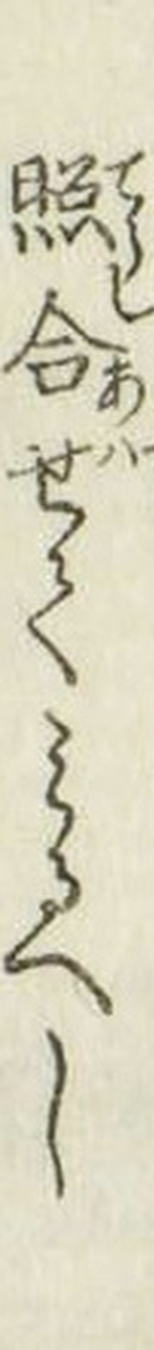照合せてみるへし
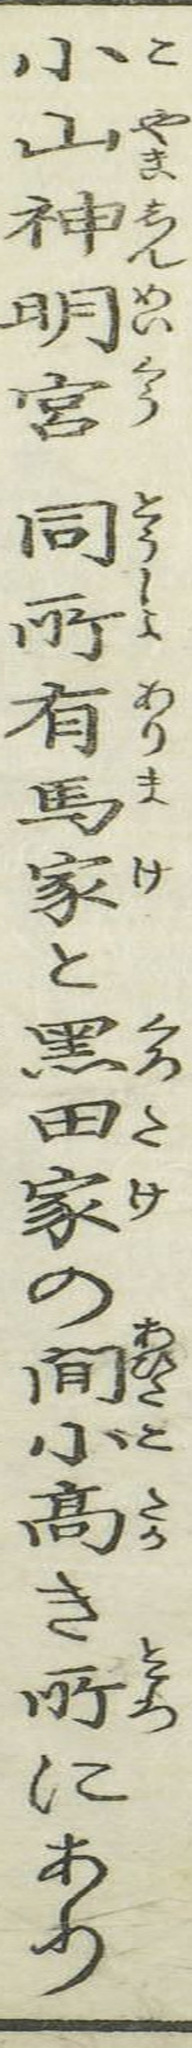小山神明宮同所有馬家と黒田家の間小高き所にあり
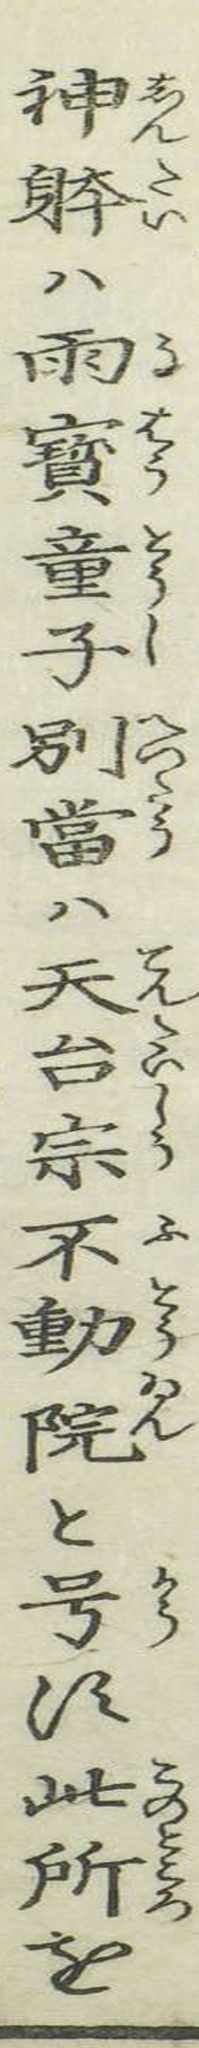神躰は雨寳童子別當は天台宗不動院と号す此所を
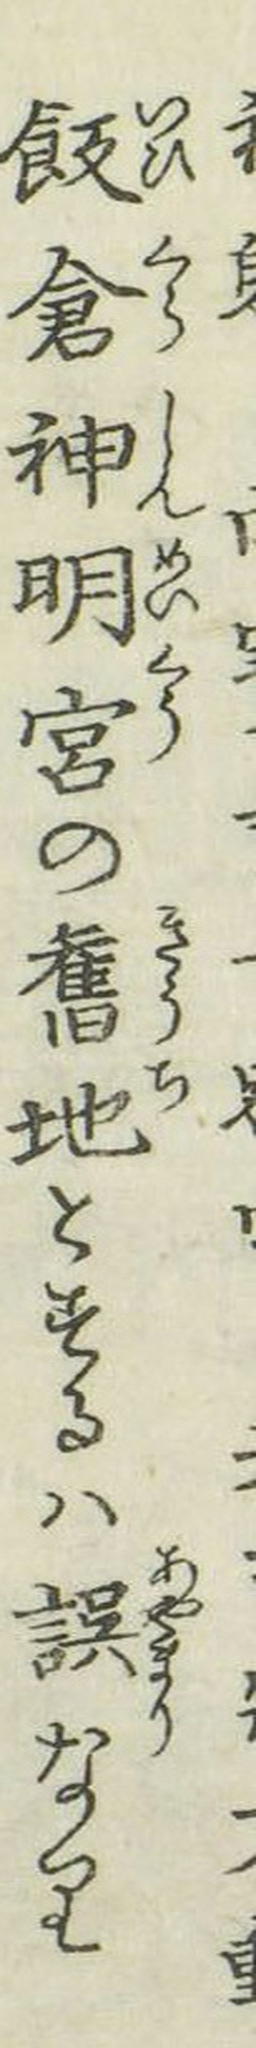飯倉神明宮の舊地とするは誤なり

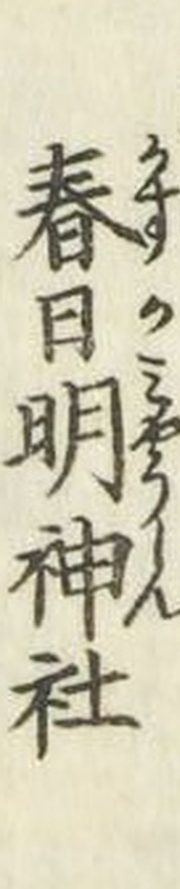春日明神社
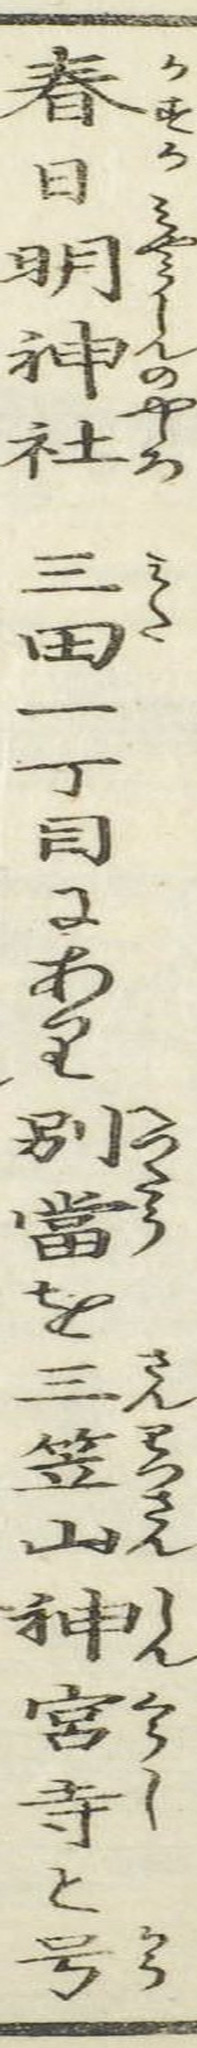春日明神社三田一丁目にあり別當を三笠山神宮寺と号
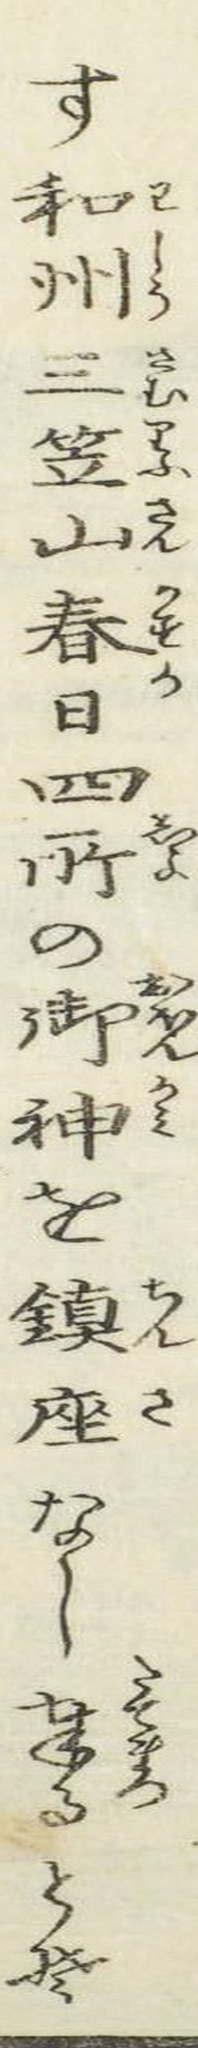す和州三笠山春日四所の御神を鎮座なし奉るとそ
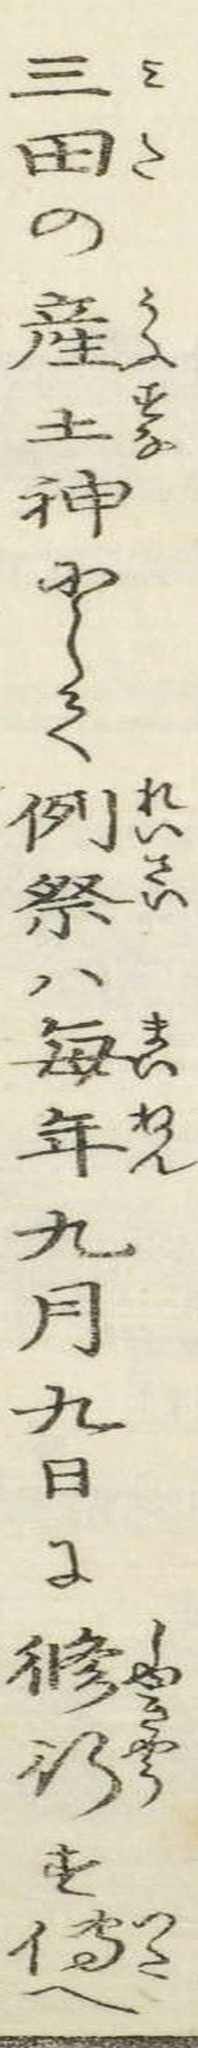三田の産土神にして例祭は毎年九月九日に修行す傳へ
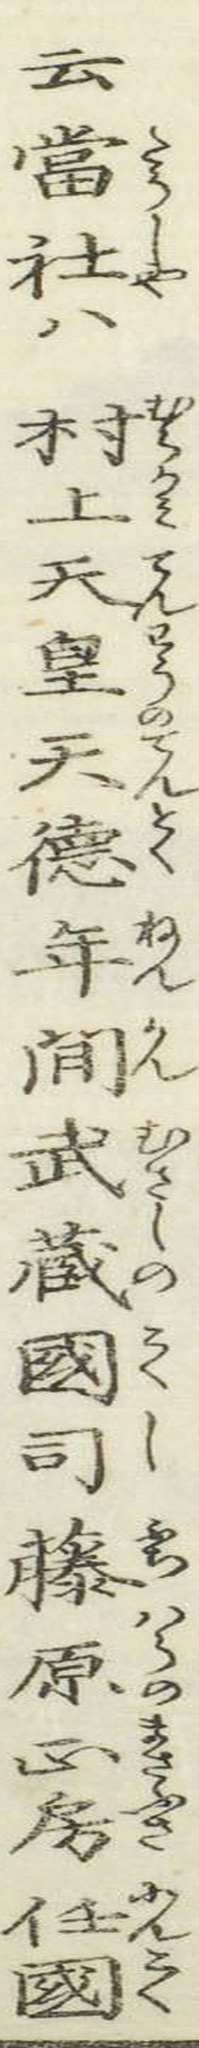云當社は村上天皇天徳年間武蔵國司藤原正房任國
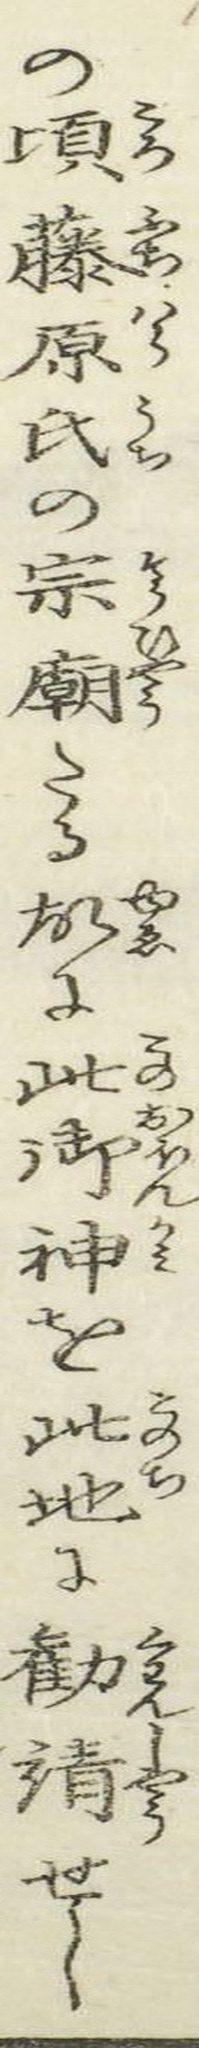の頃藤原氏の宗廟たる故に此御神を此地に勧請せし
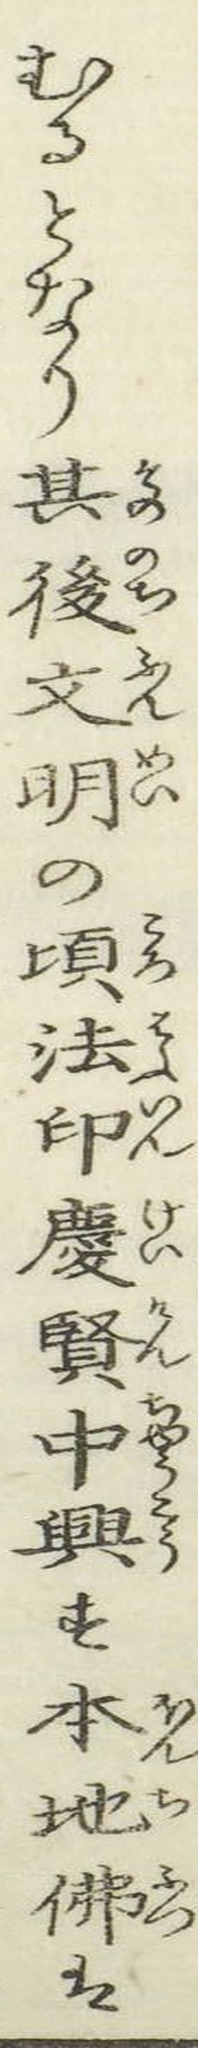むるとなり其後文明の頃法印慶賢中興す本地佛は
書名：江戸名所図会 20巻 巻之3
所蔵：東京学芸大学教育コンテンツアーカイブ
